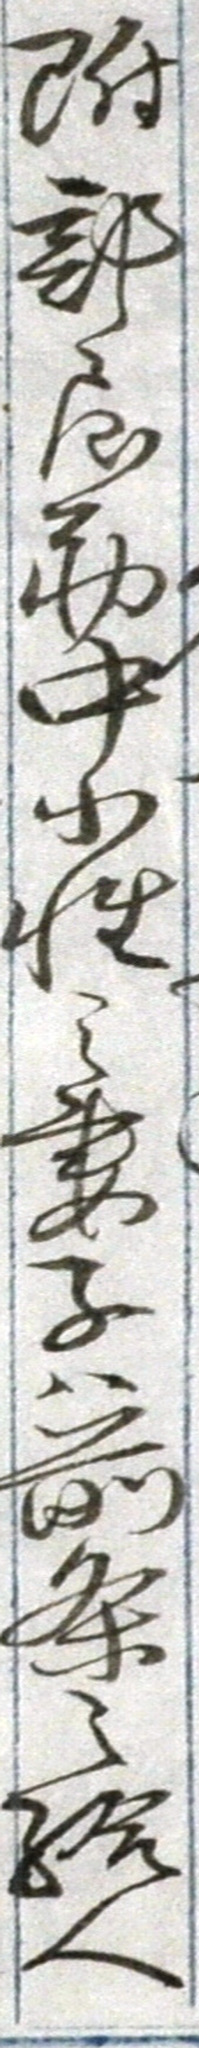附部屋勤中小性之妻子ハ前条之給人
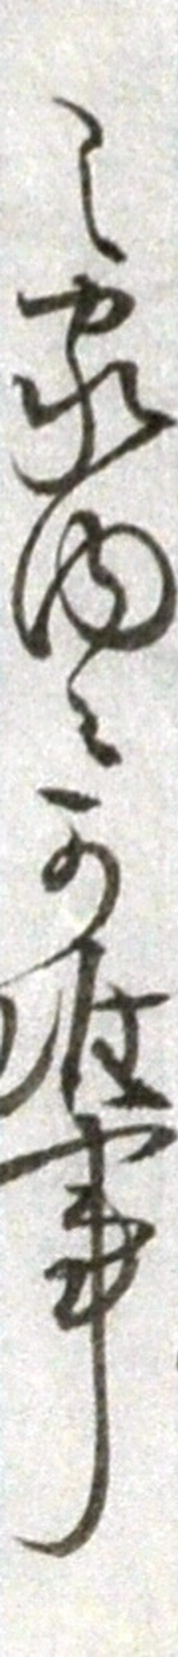之家内ニ可准事
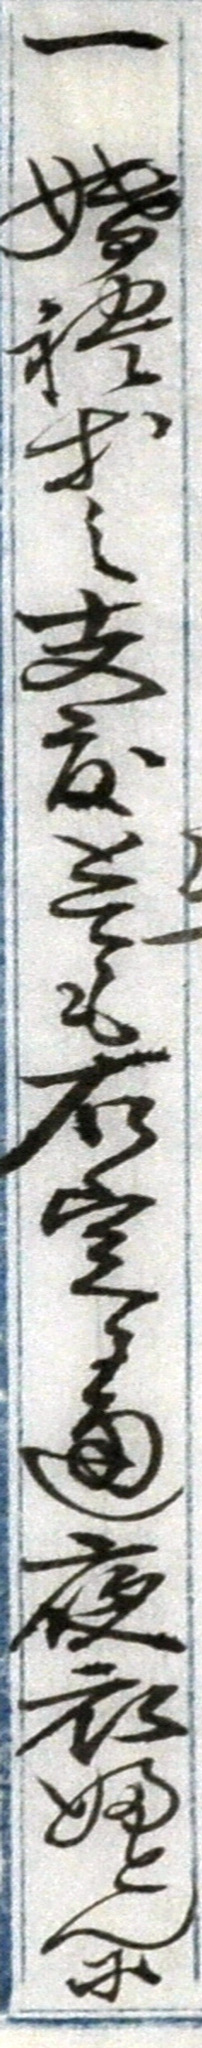一婚礼等之支度とても右定之通夜衣ふとんに
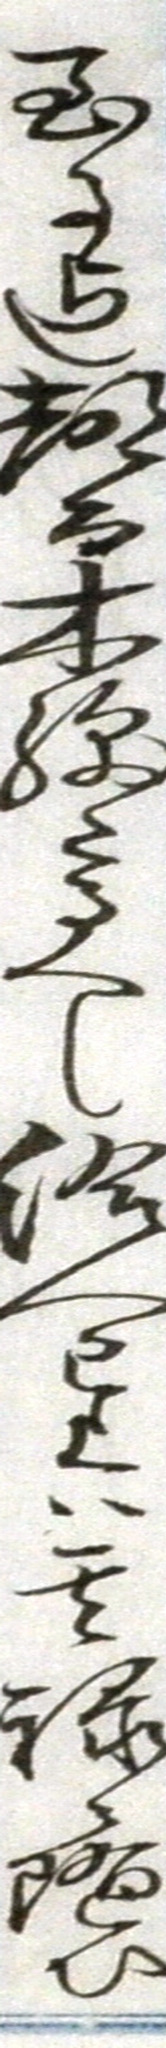至る迄都而本綿たるへし給人已上ハ其禄ニ随ひ
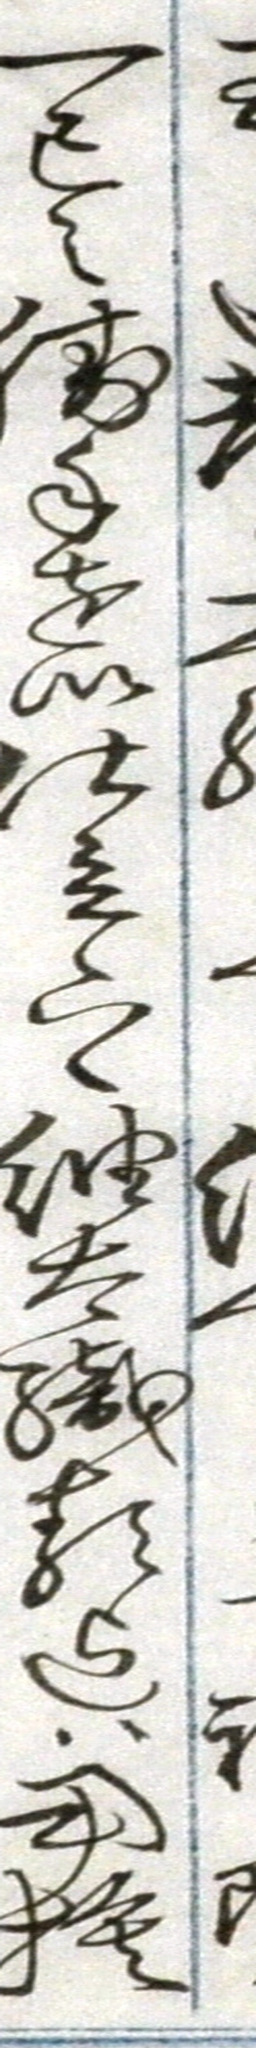一己之勝手を以仕立候ハヽ紬太織類迄ハ用捨
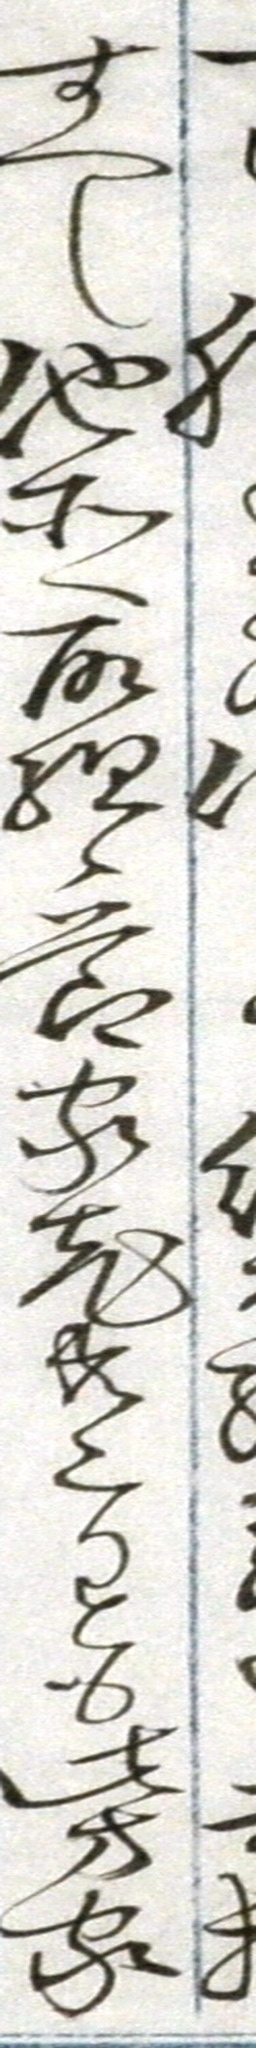すへし他所へ取組候節家老共たりとも此方家
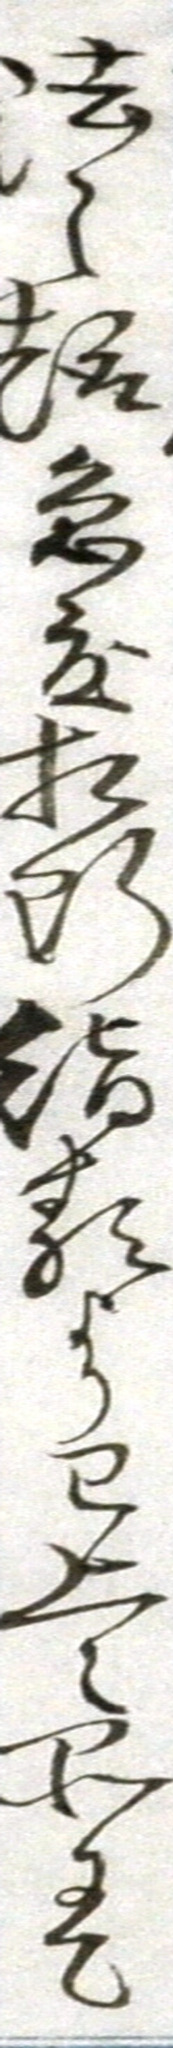法之趣急度相断絹類より已上之品にて
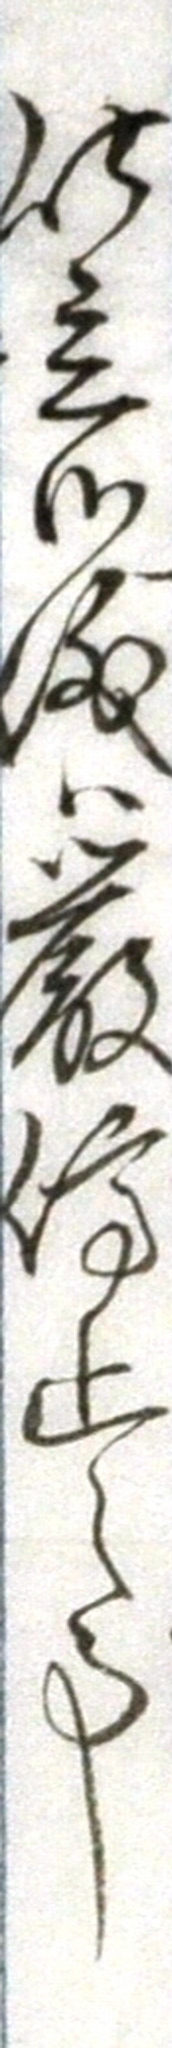仕立候儀ハ厳停止之事
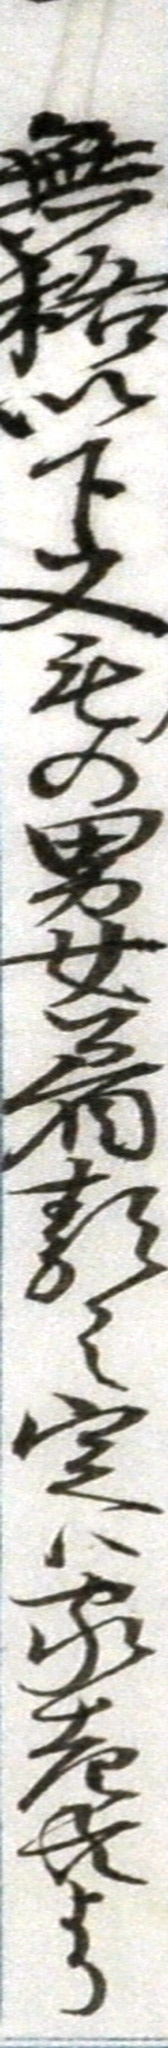一無格以下又もの男女着類之定ハ家老共より
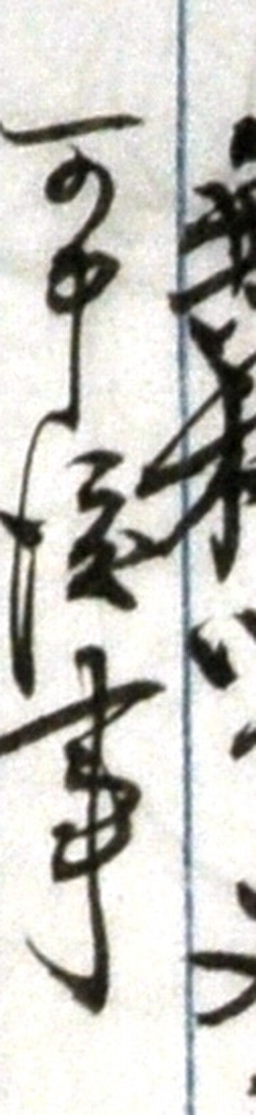可申渡事
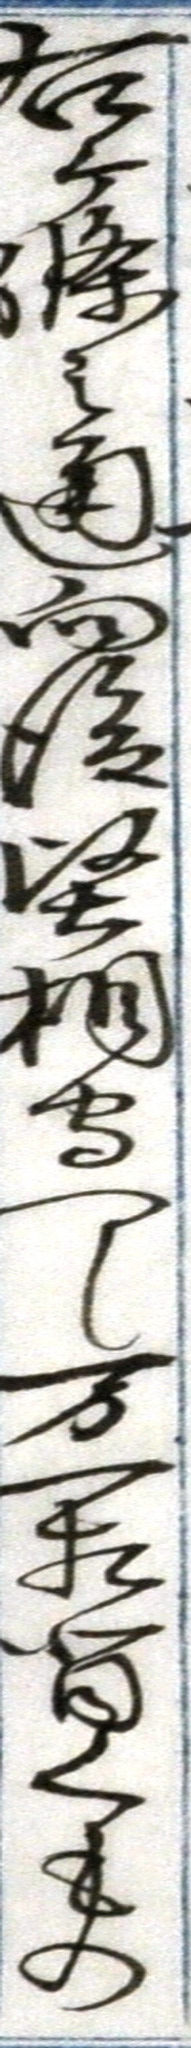右ヶ條之通向後堅相守へし万一相背くもの
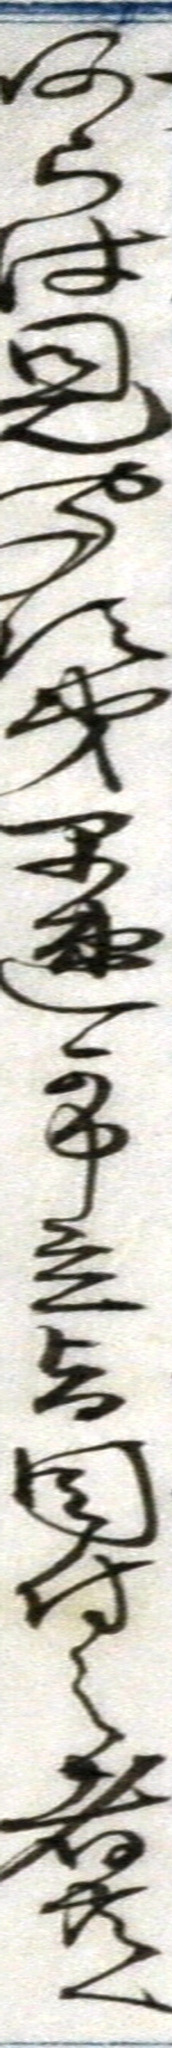あらは見聞次第早速可申立旨目付之者共へ
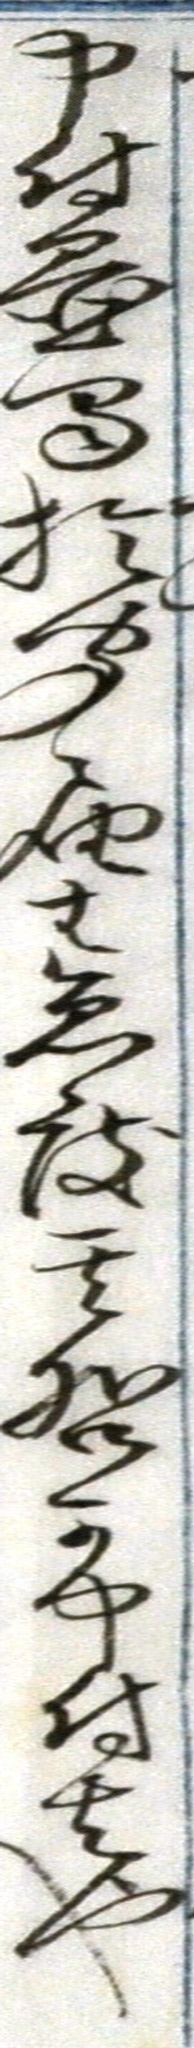申付置間於聞届は急度其咎可申付者也
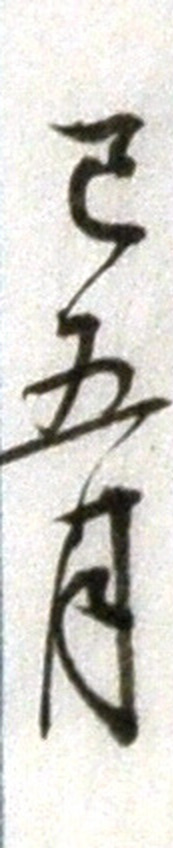巳五月

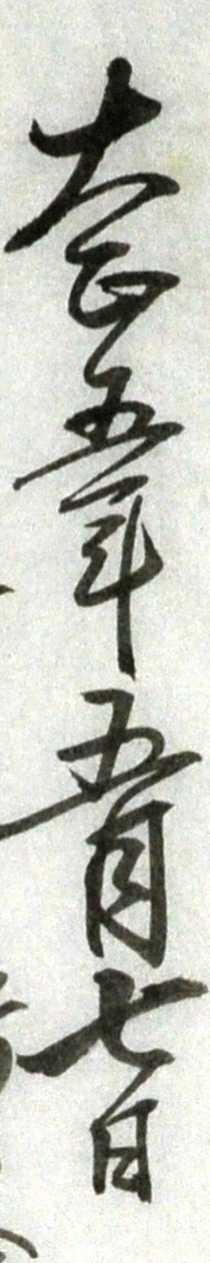大正五年五月七日
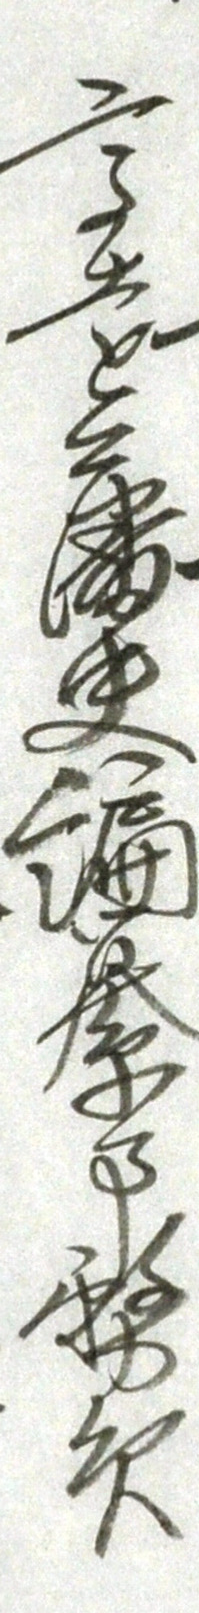高遠藩史編纂事務員
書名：頼由公（源隆院殿）御定
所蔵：伊那市立高遠町図書館・合同会社AMANE
